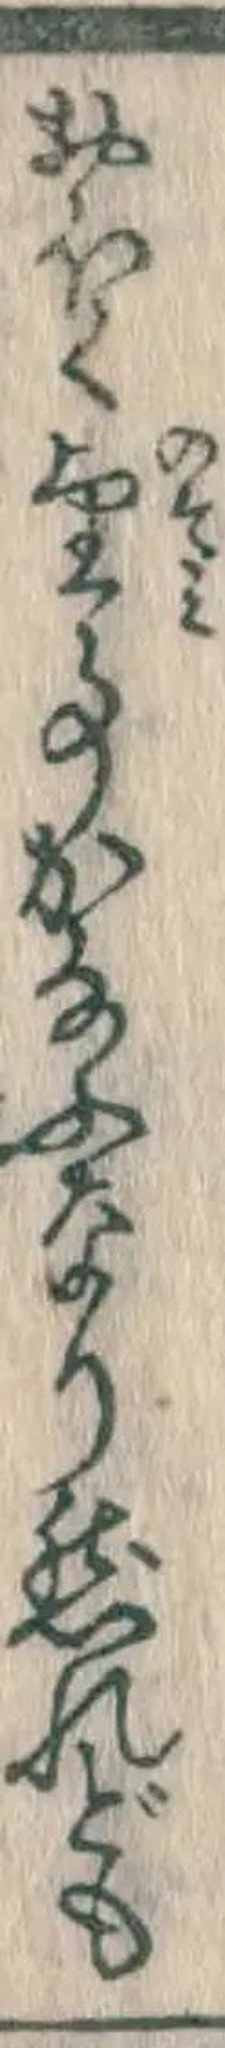おほく望事かなふなり然れども
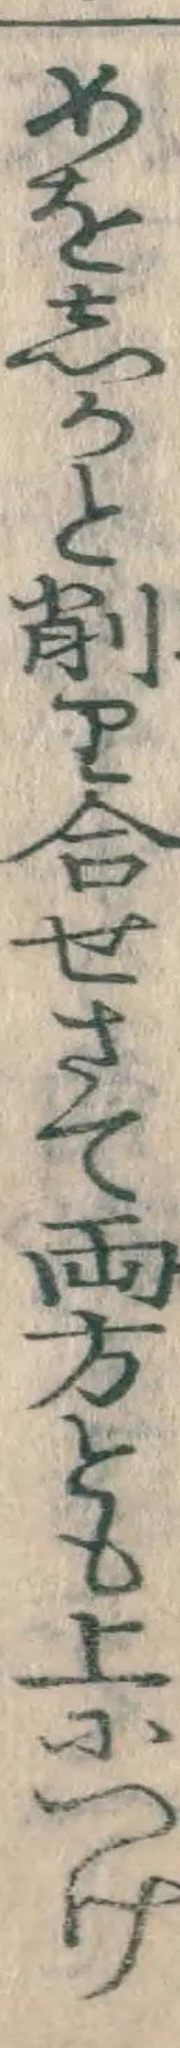めをしかと削り合せさて両方とも上につけ
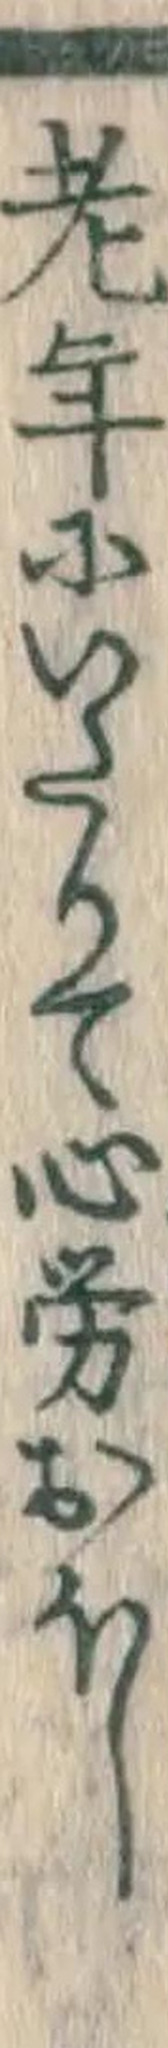老年にいたりて心労おほし
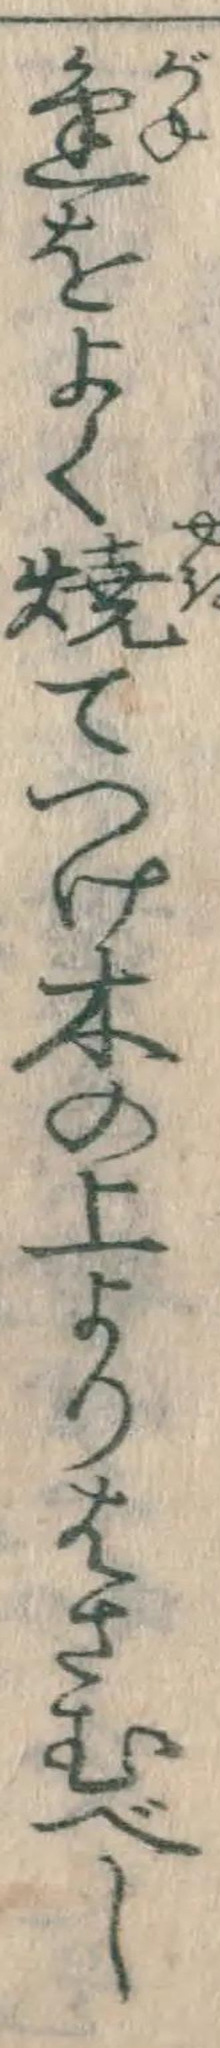金をよく焼てつけ木の上よりはさむべし
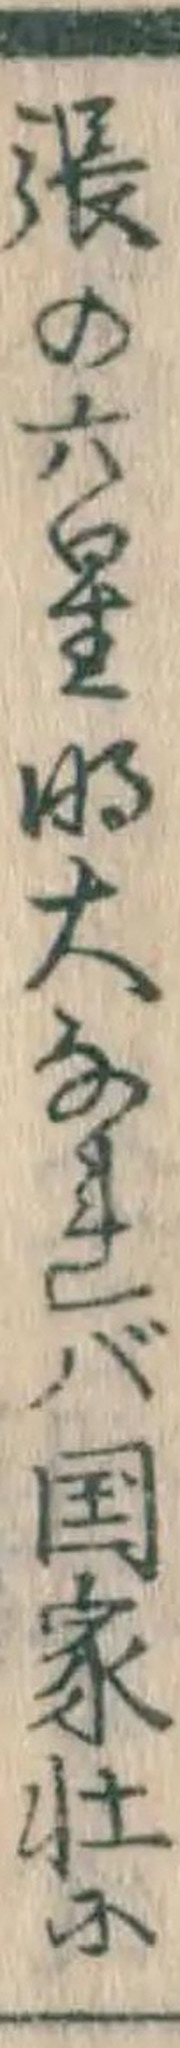張の六星明大なれば国家壮に
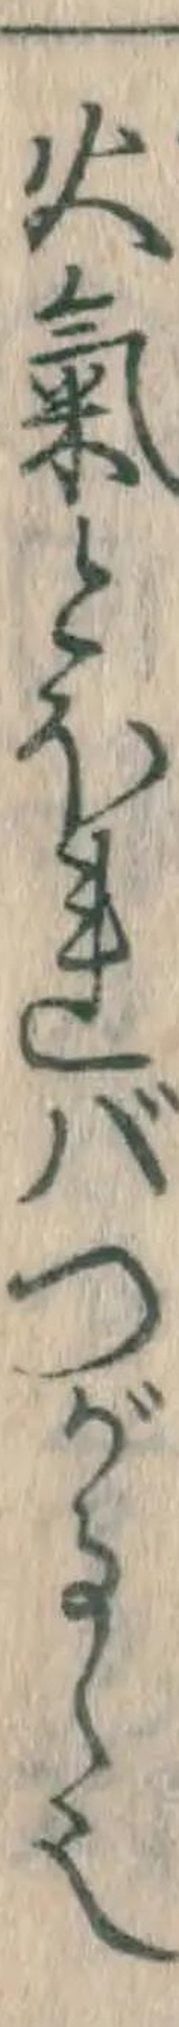火気とほればつがるゝ也

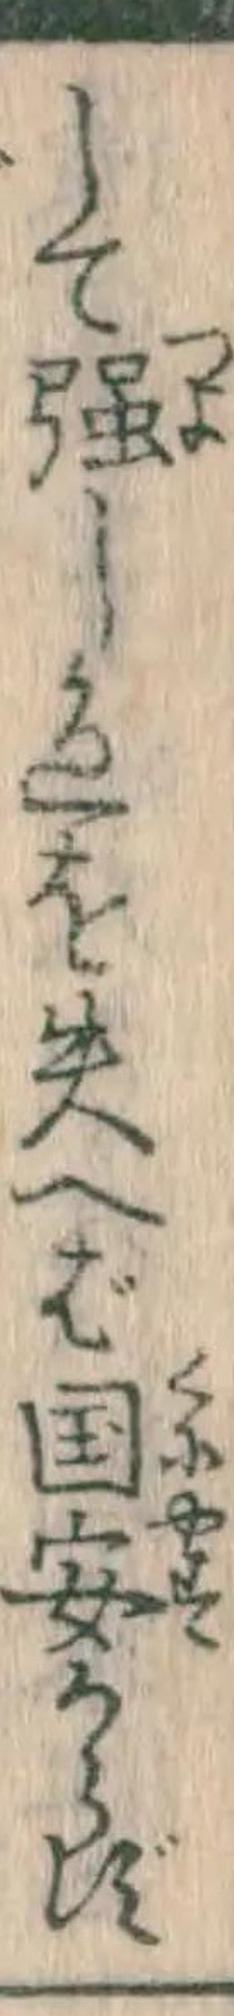して強し色を失へば国安からず
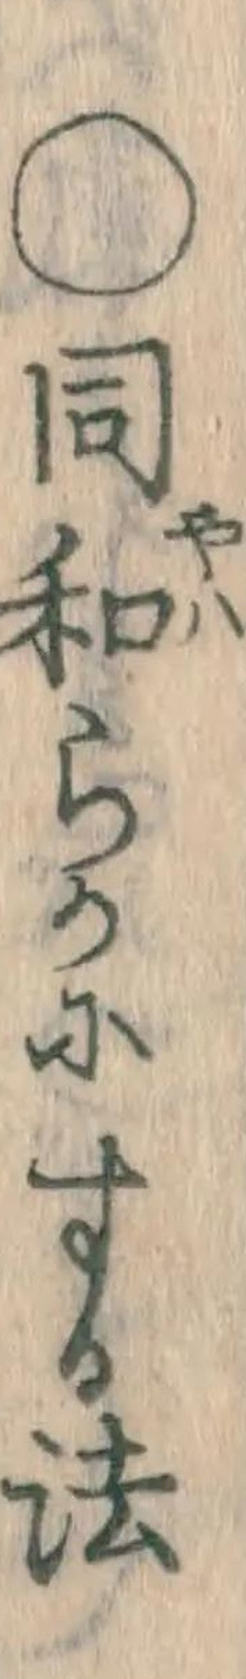○同和らかにする法
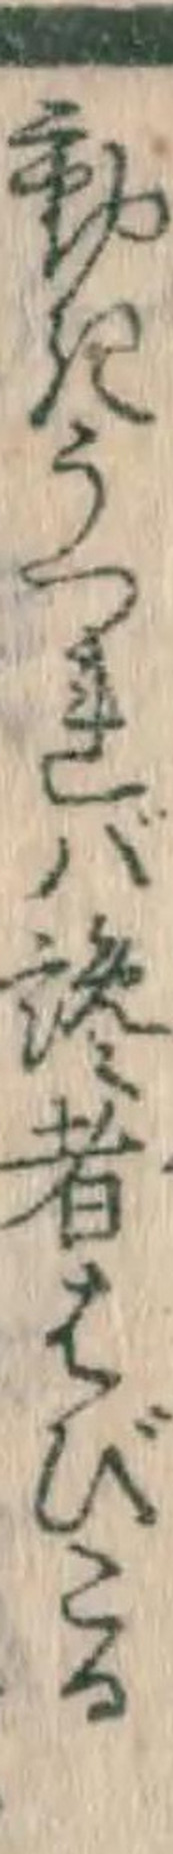動きうつれば讒者はびこる
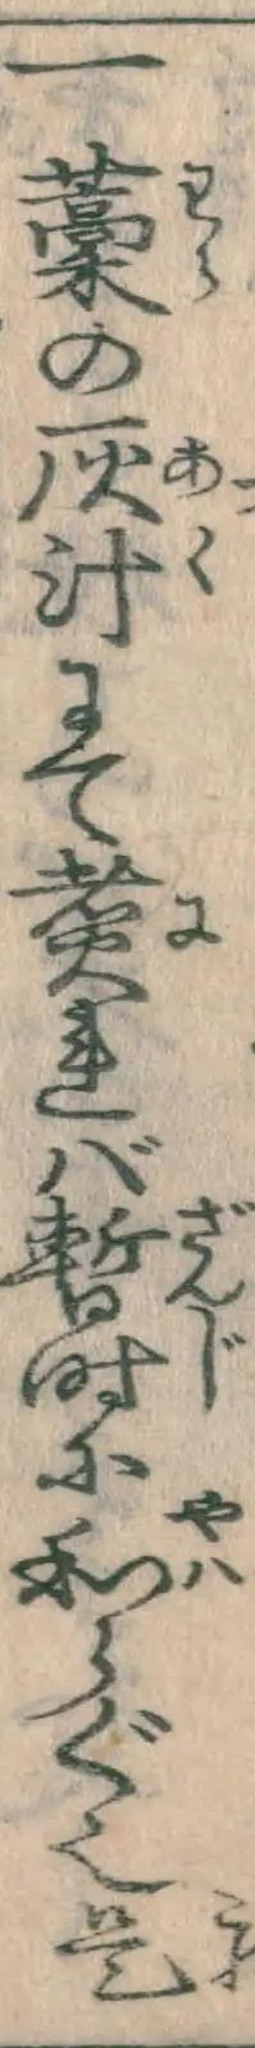一藁の灰汁にて煮れば暫時に和らぐ也是
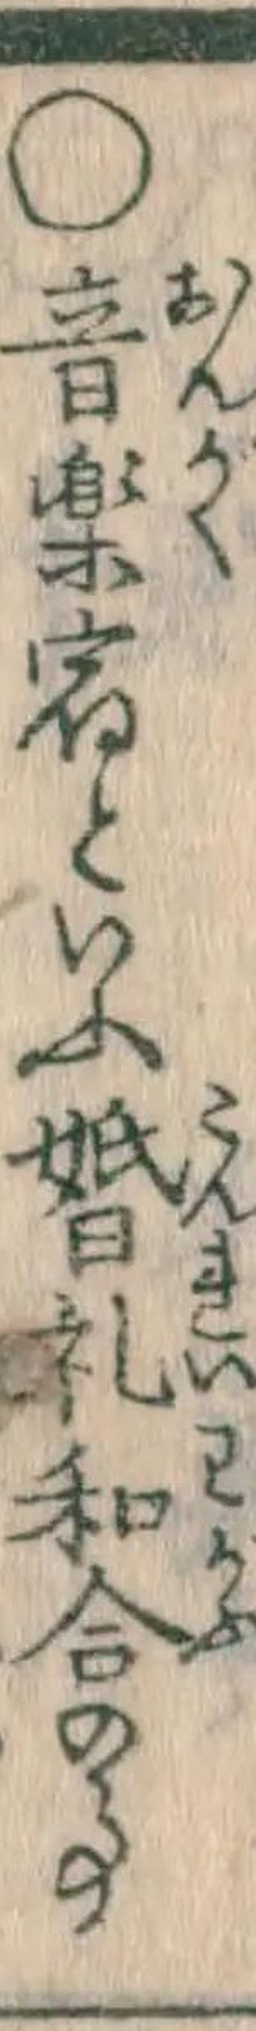○音楽宿といふ婚礼和合の事
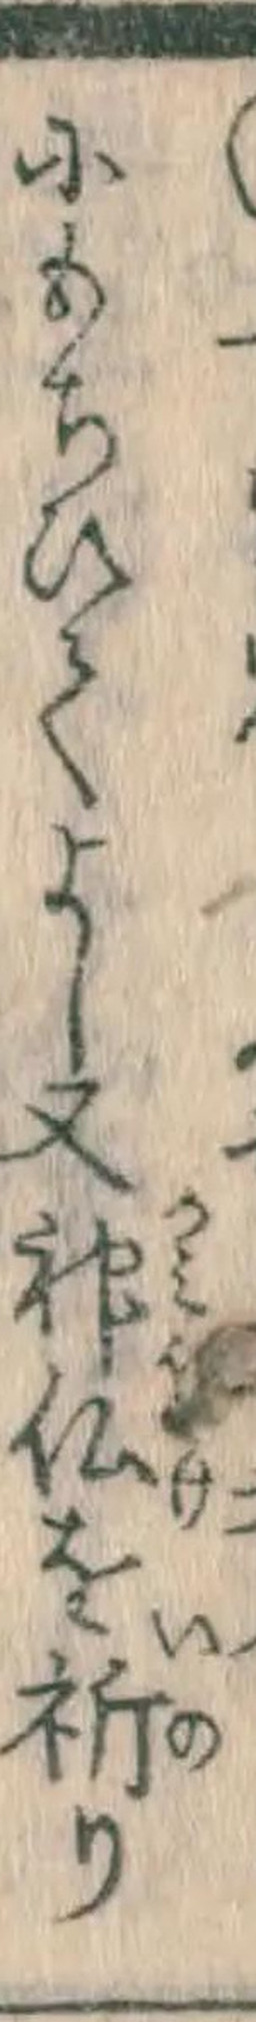にもちひてよし又神仏を祈り
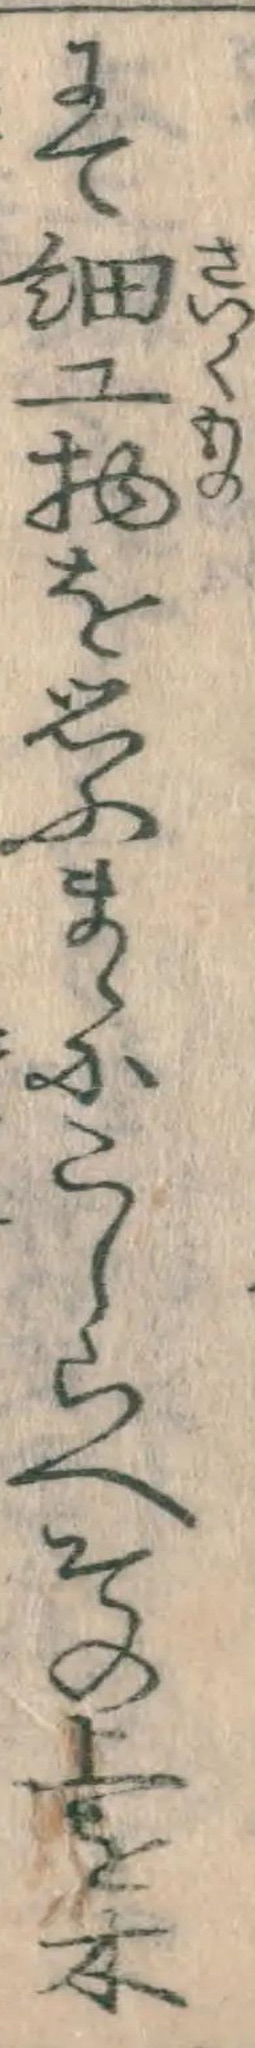にて細工物を思ふまゝにこしらへその上を木
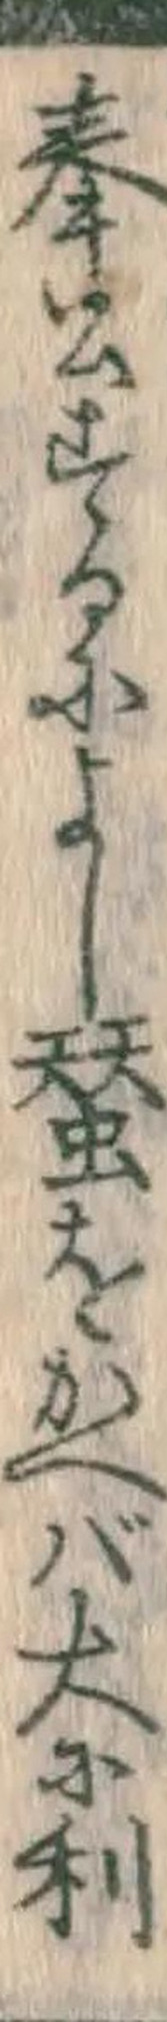奉公するによし蚕をかへば大に利
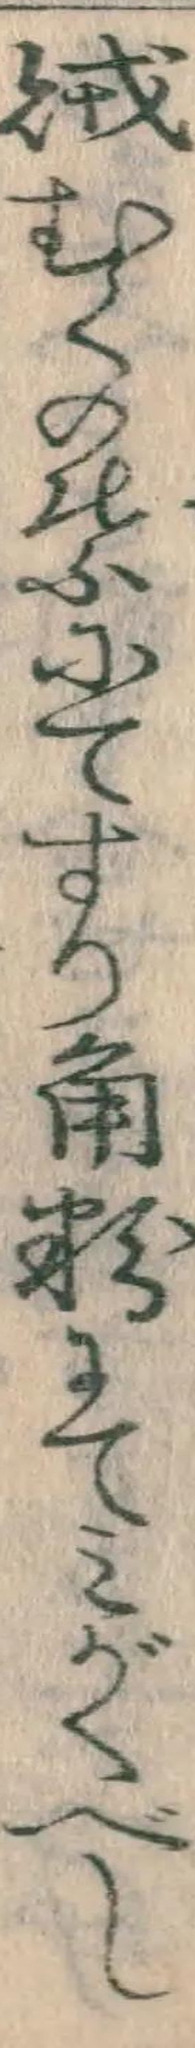賊むくの葉にてすり角粉にてみがくべし
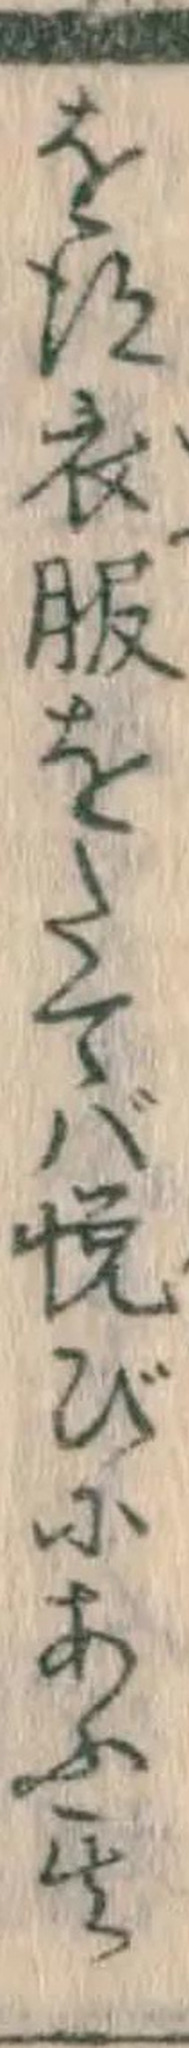を得衣服をたてば悦びにあふ其
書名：広益秘事大全 3巻. [2]
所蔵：国立国会図書館 National Diet Library, JAPAN
